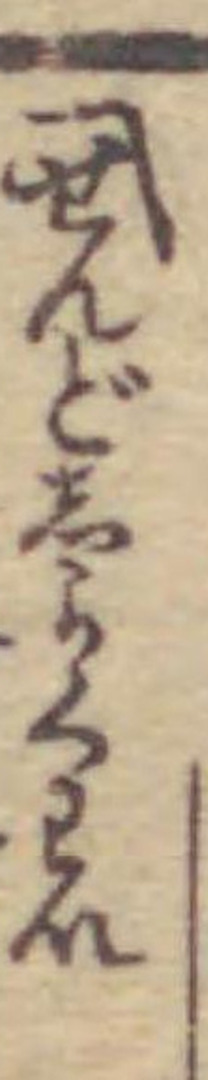〽せんどしよくわい
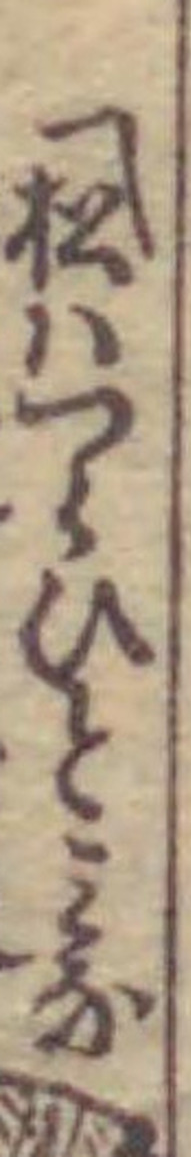〽松はつらひとみな
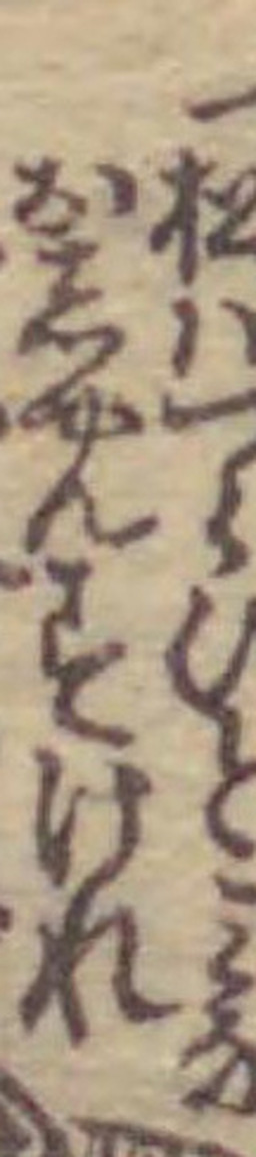おしやんすけれ
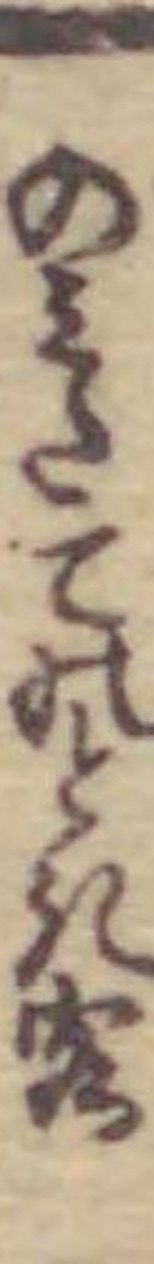のみたてのとき客
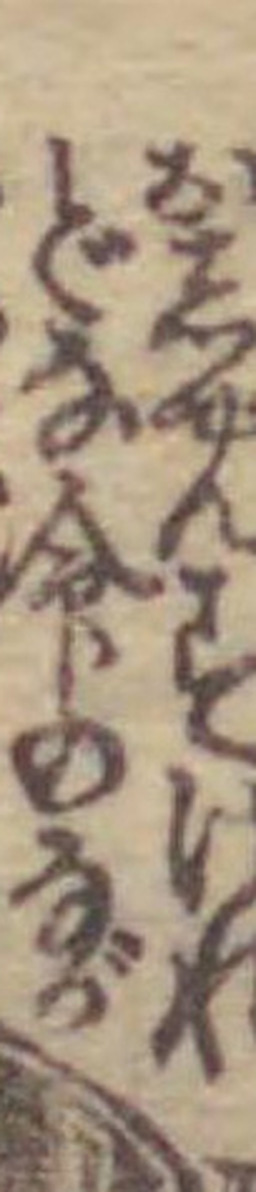どな命のなが
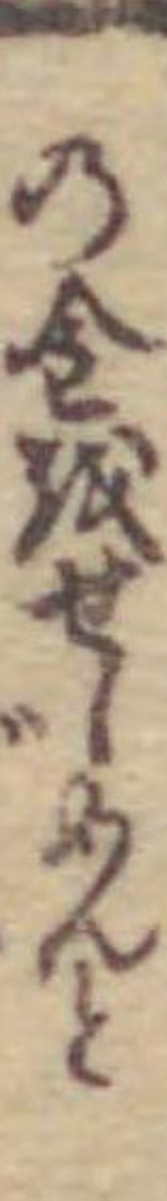の金をせしめんと
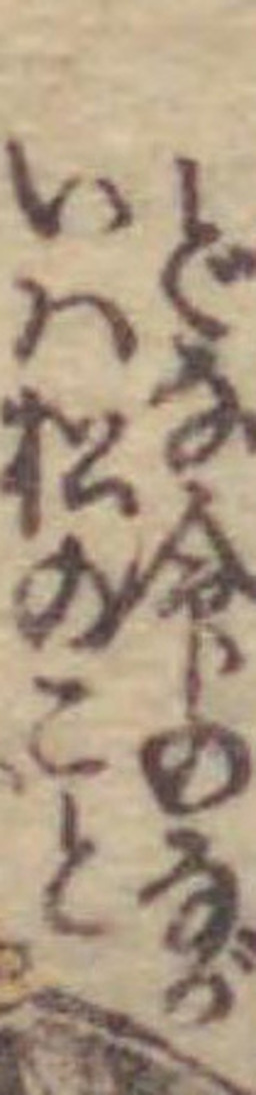いは松のこと
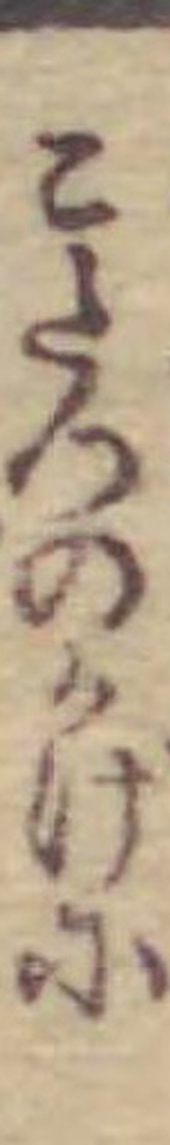こたつのかげに
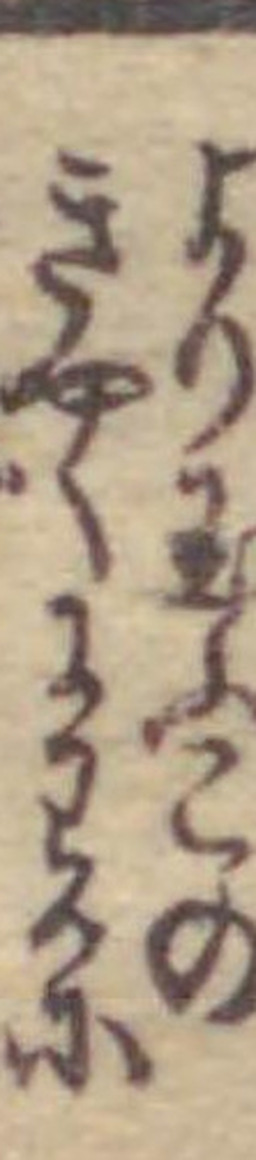きやくにわかに
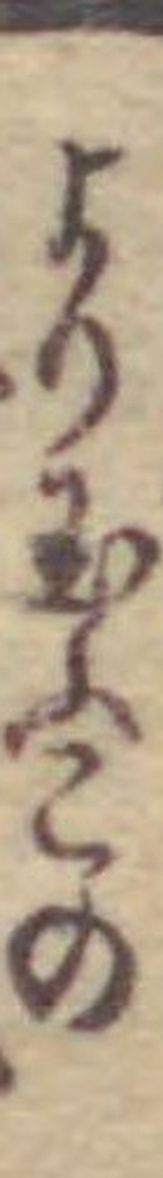より玉ふこの
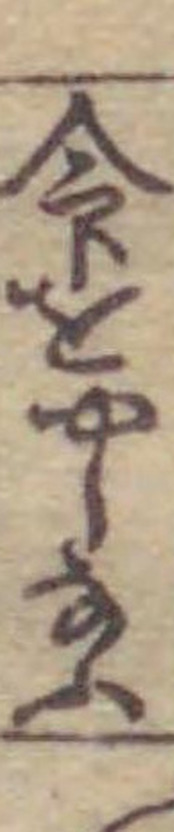をやしなふ
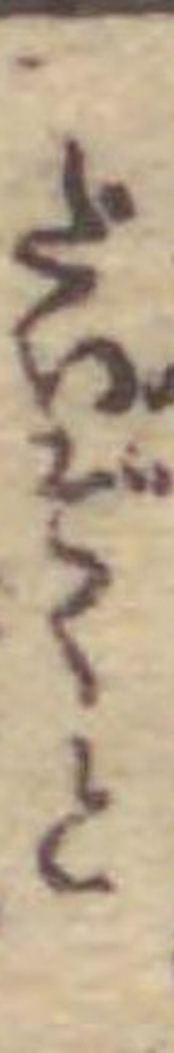だいぞくと
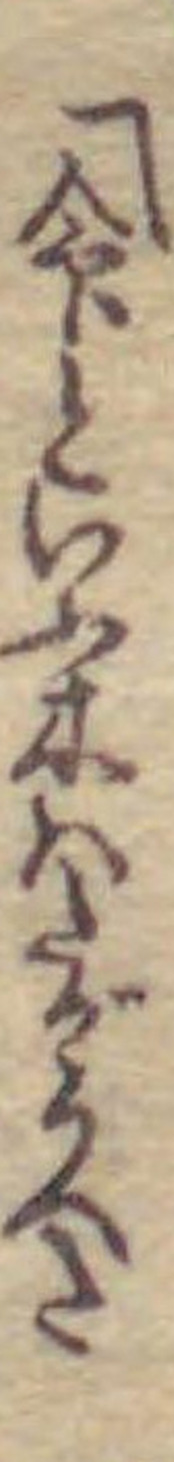〽命といふ木はたがうへた
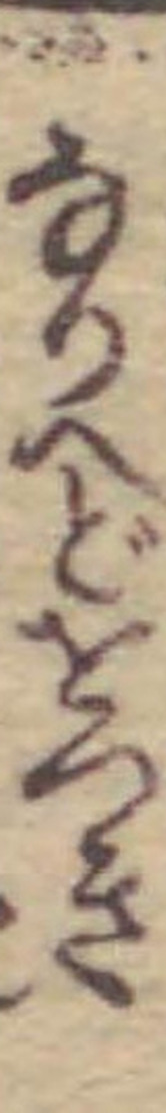なりへどをつき
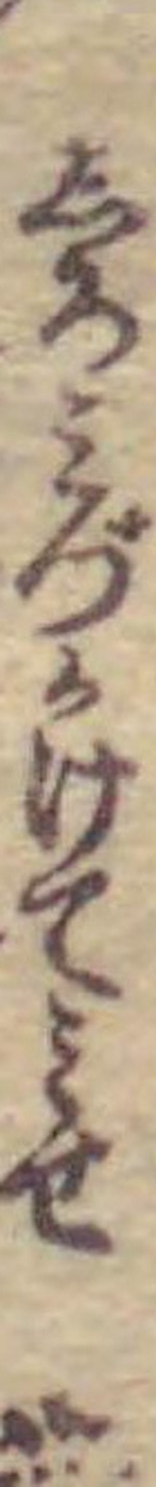しろみづかけてみせ
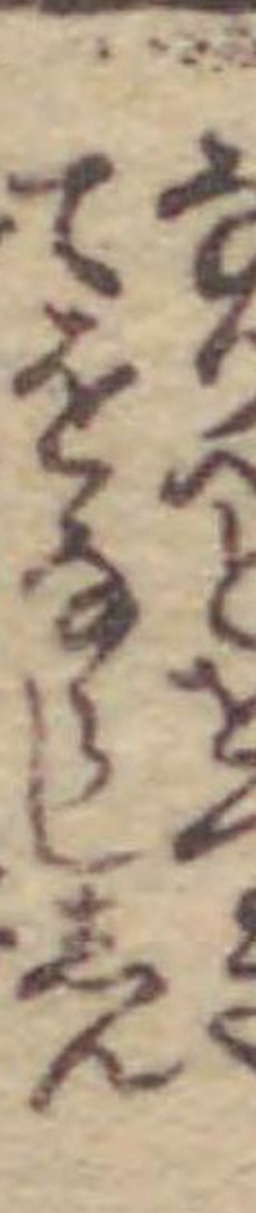てをならししん
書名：御誂染長寿小紋 : 3巻
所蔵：国立国会図書館 National Diet Library, JAPAN
